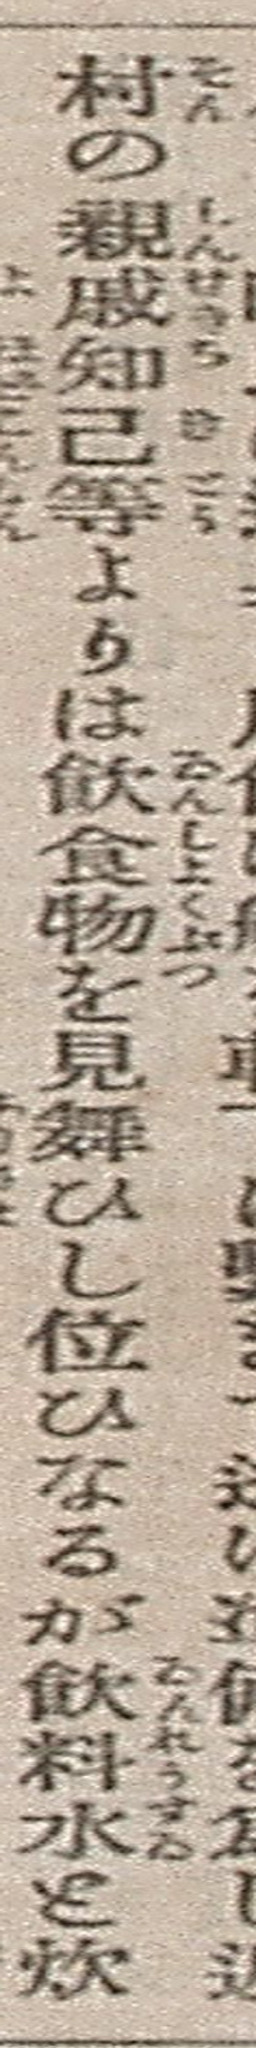村の親戚知己等よりは飲食物を見舞ひし位ひなるが飲料水と炊
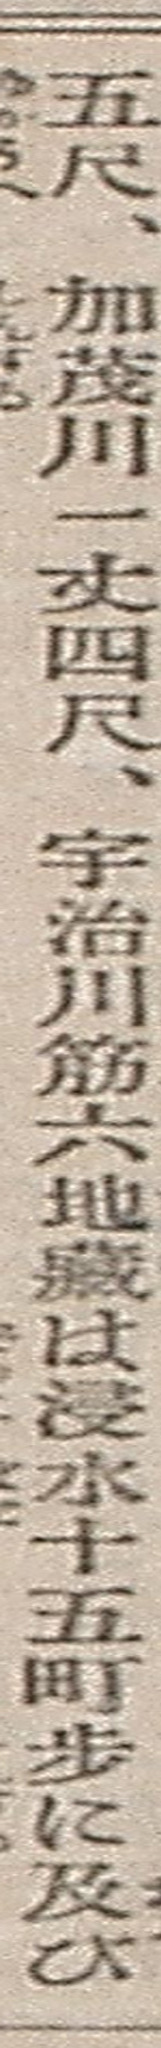五尺、賀茂川一丈四尺、宇治川筋六地蔵は浸水十五町歩に及び
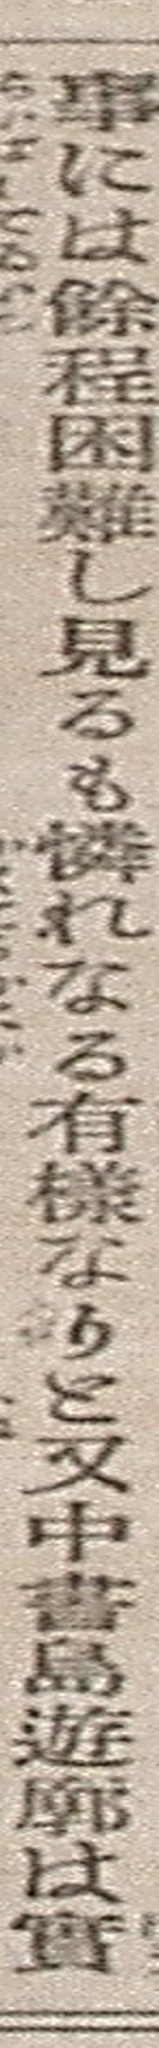事には余程困難し見るも憐れなる有様なりと又中書島遊郭は宝
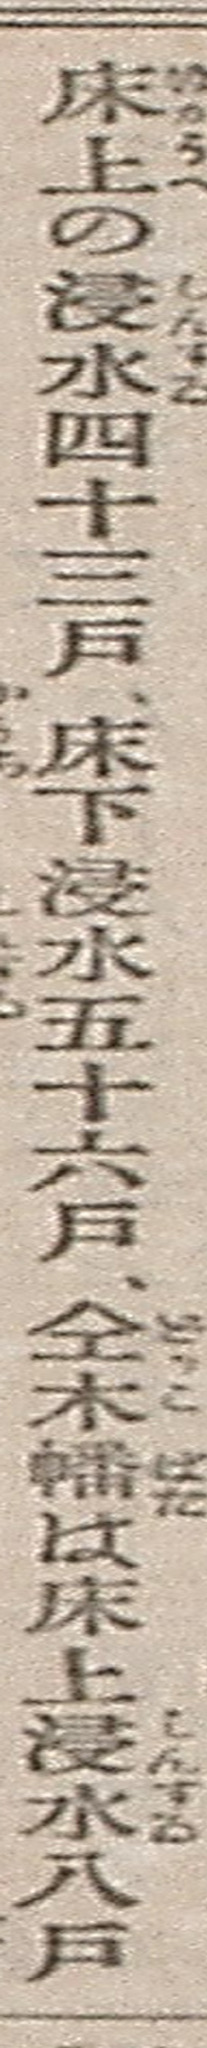床上の浸水四十三戸、床下浸水五十六戸、同木幡は床上浸水八戸
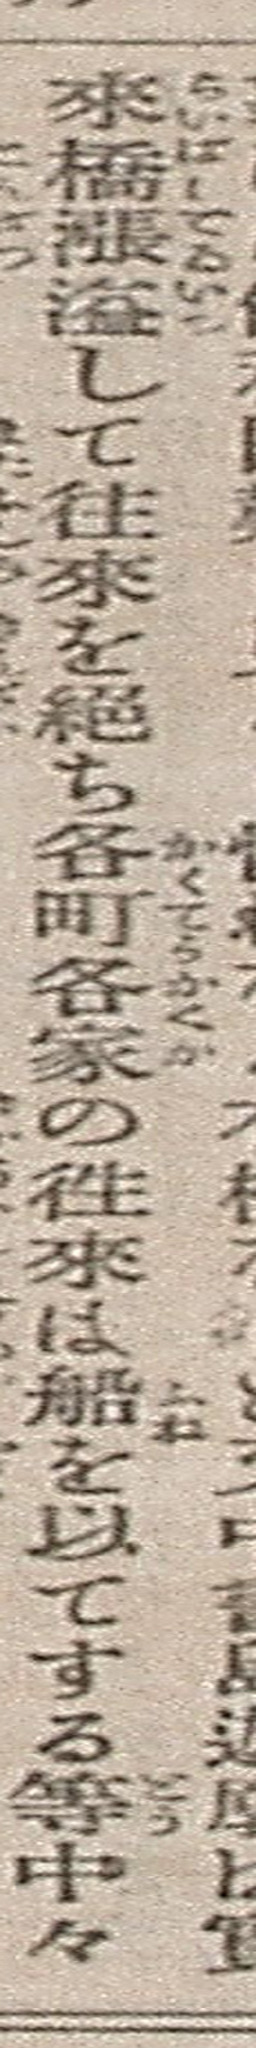来橋漲溢して往来を絶ち各町各家の往来は船を以てする等中々
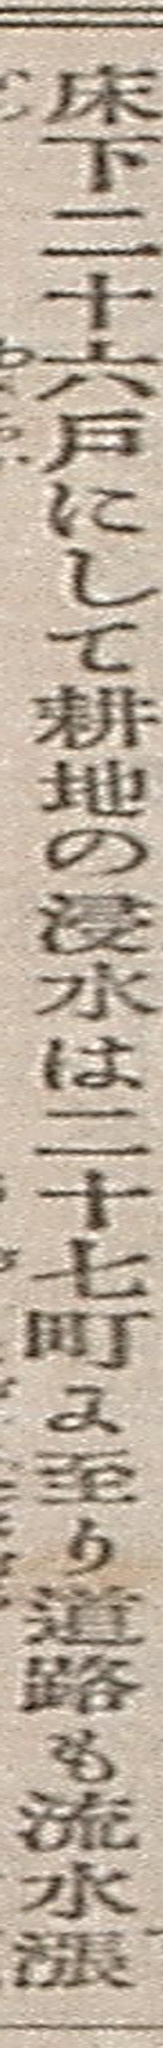床下二十六戸にして耕地の浸水は二十七町に至り道路も流水漲
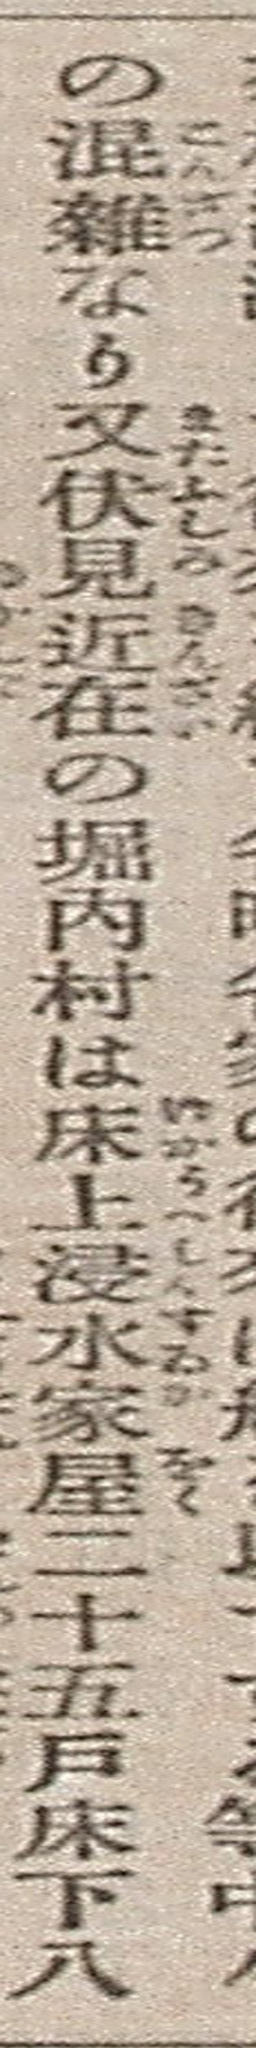の混雑なり又伏見近在の堀内村は床上浸水家屋二十五戸床下八
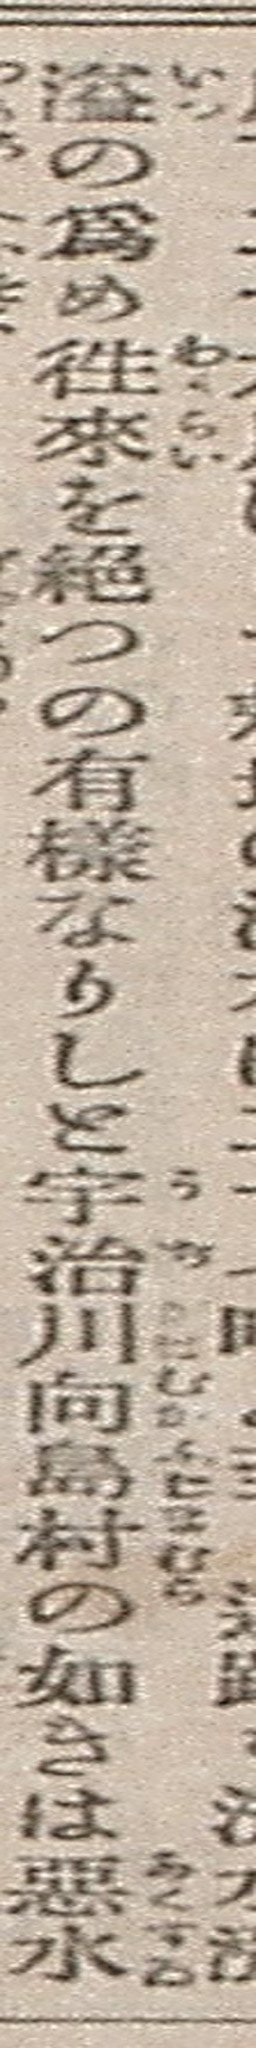溢の為め往来を絶つの有様なりしと宇治川向島村の如きは悪水
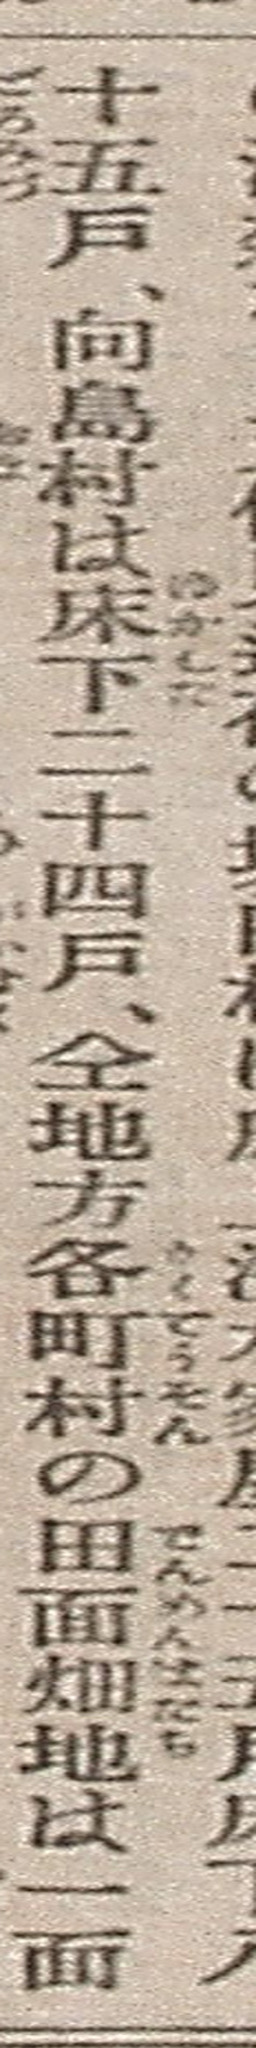十五戸、向島村は床下二十四戸、同地方各町村の田面畑地は一面
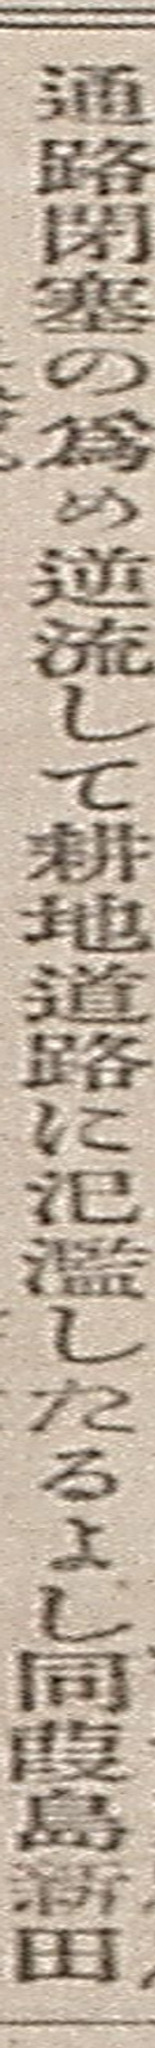通路閉塞の為め逆流して耕地道路に氾濫したるよし同葭島新田
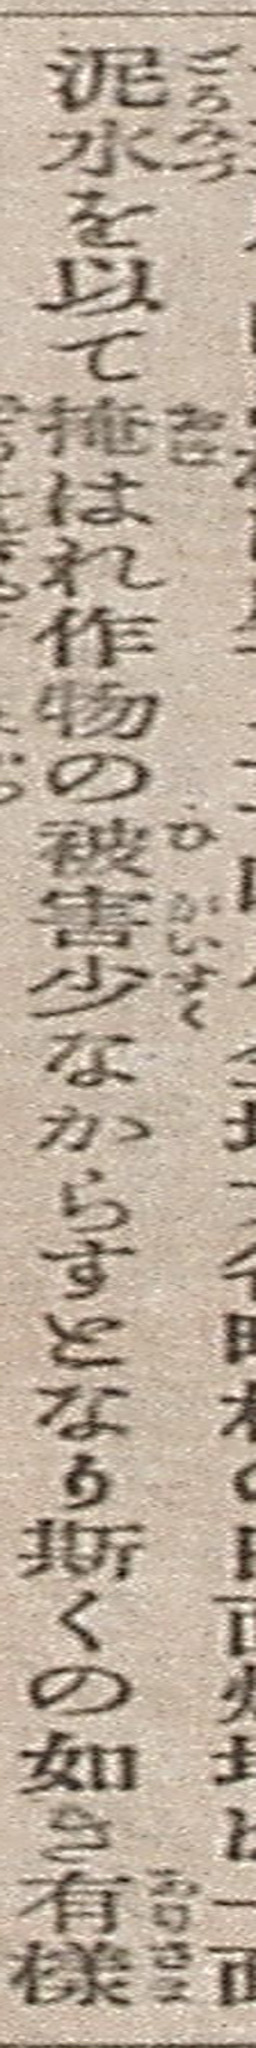泥水を以て掩はれ作物の被害少なからすとなり斯くの如き有様
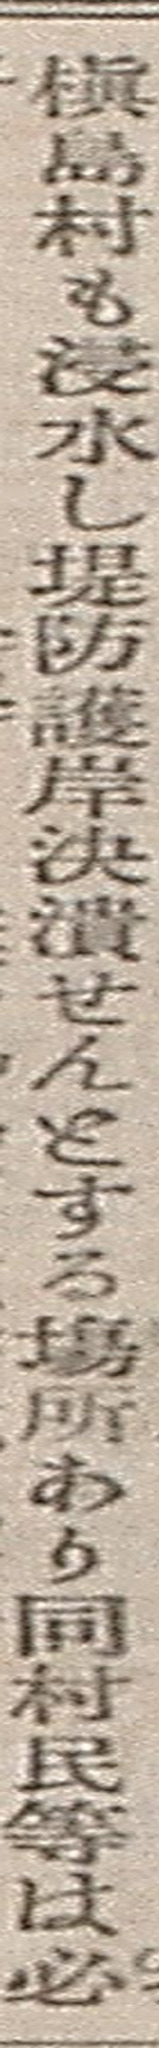槇島村も浸水し堤防護岸決潰せんとする場所あり同村民等は必
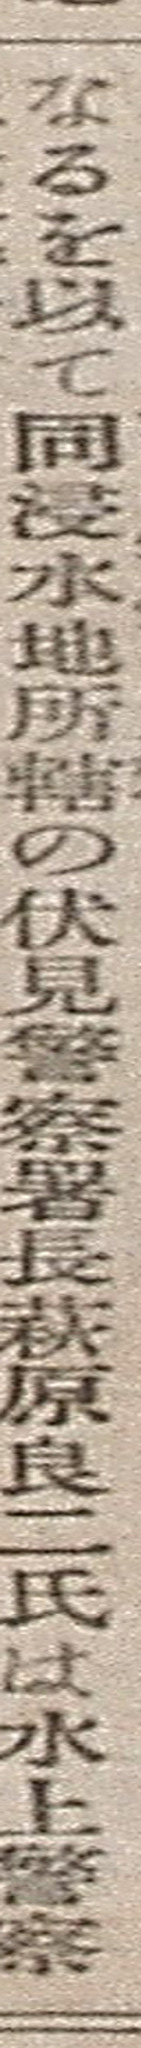なるを以て同浸水地所轄の伏見警察署長荻原良二は水上警察
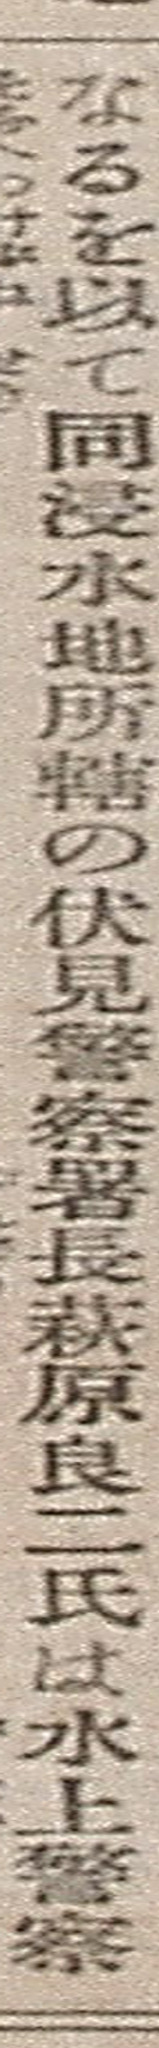なるを以て同浸水地所轄の伏見警察署長荻原良二は水上警察
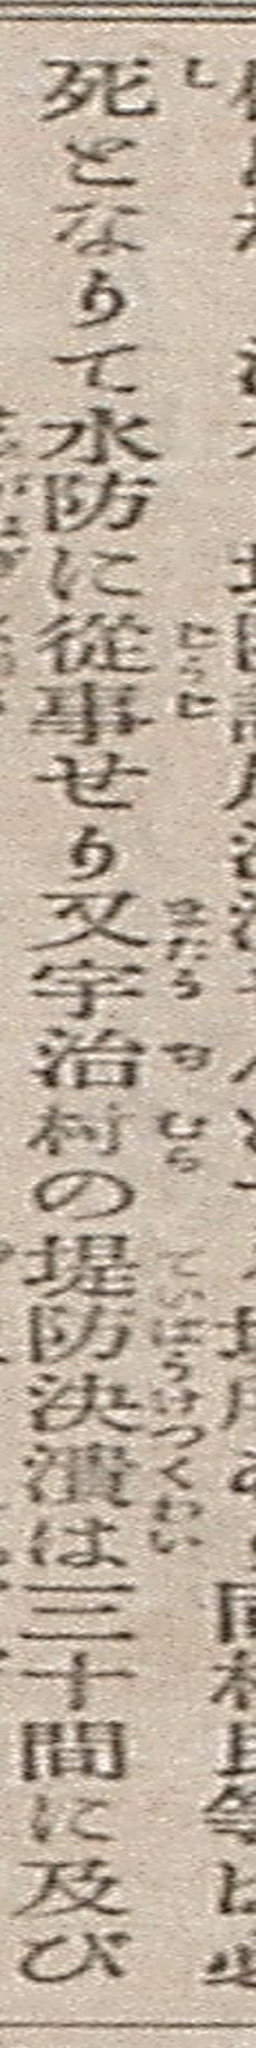死となりて水防に従事せり又宇治村の堤防決潰は三十間に及び
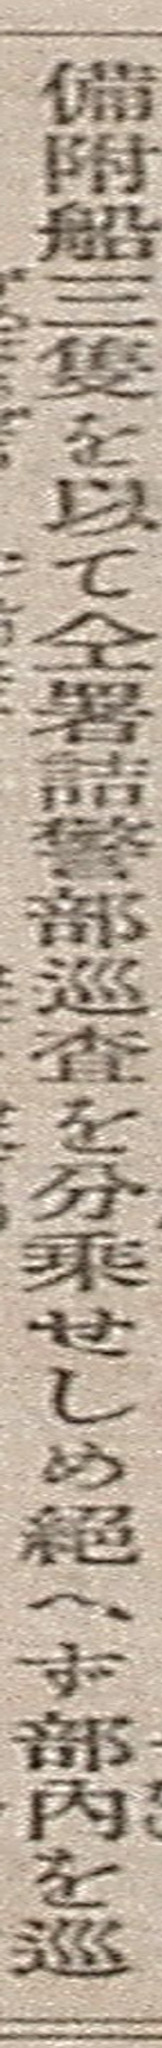備附船三隻を以て同署詰警部巡査を分乗せしめ絶へず部内を巡
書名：風俗畫報臨時増刊第百二十八號　洪水被害録（下）
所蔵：東京大学地震研究所図書室 Earthquake Research Institute Library, The University of Tokyo, JAPAN
